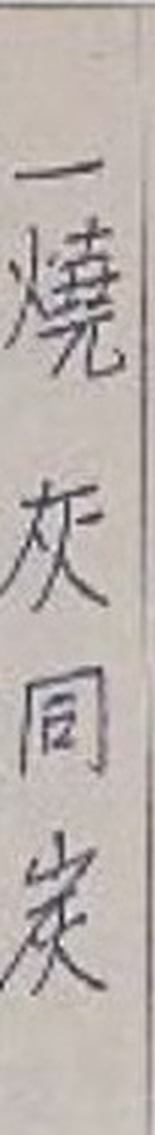一焼灰同炭
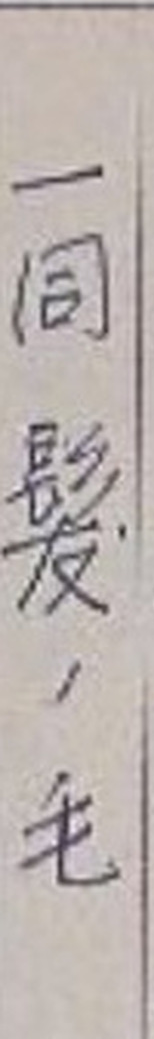一同髪の毛
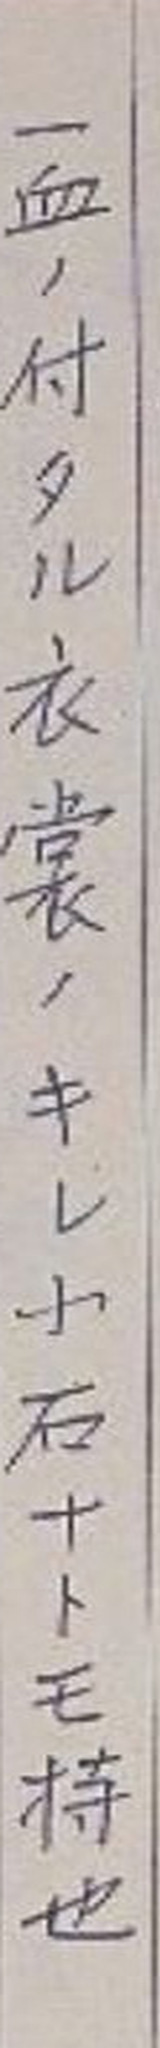一血の付たる衣裳のきれ小石なとも持也
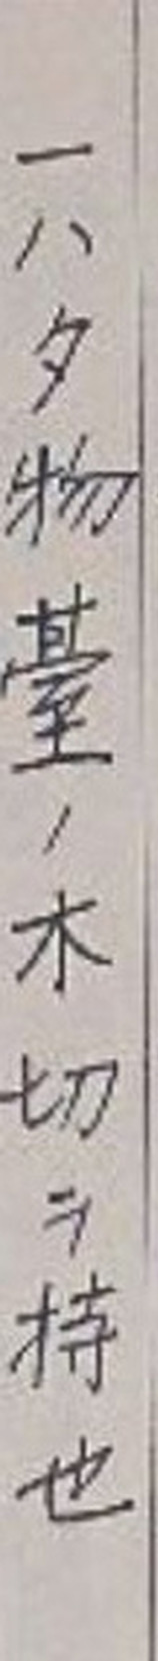一はた物台の木切を持也
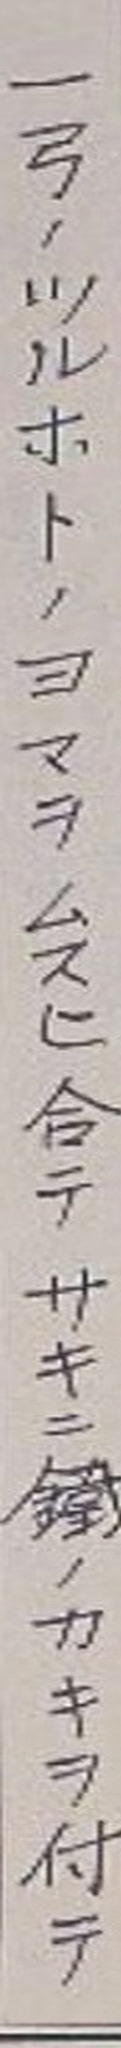一弓のつるほとのよまをむすひ合てさき鉄のかきを付て
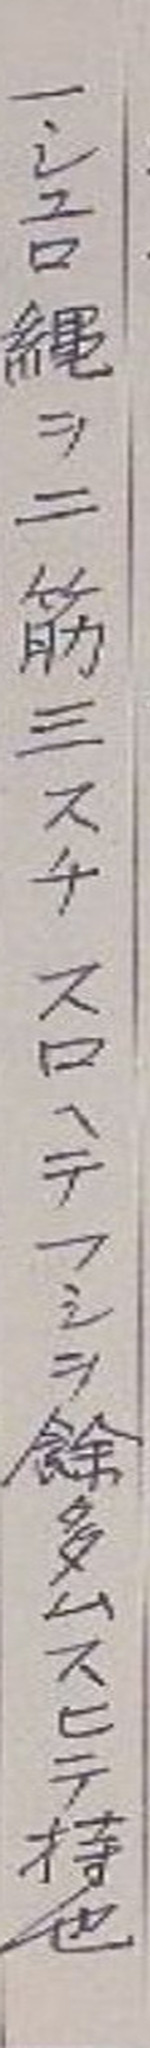一しゆろ縄を二筋三すちすろへてふしを余多むすひて持也
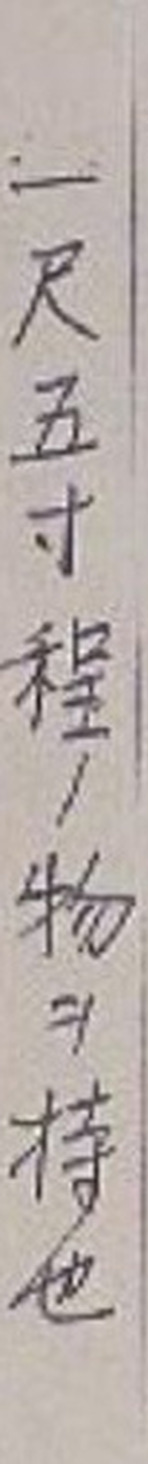一尺五寸程の物を持也

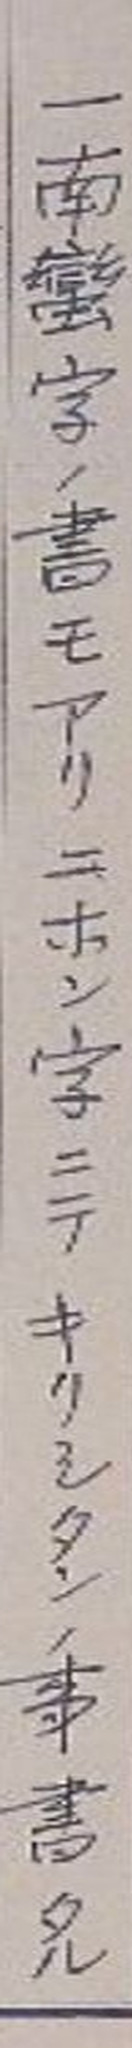一南蛮字の書もありにほん字にてきりしたんの事書たる
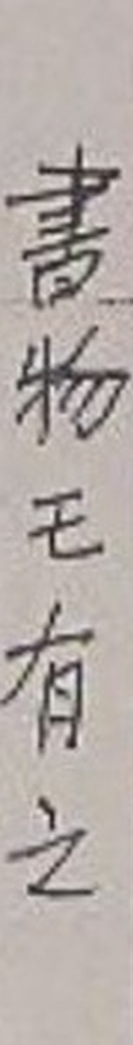書物も有之
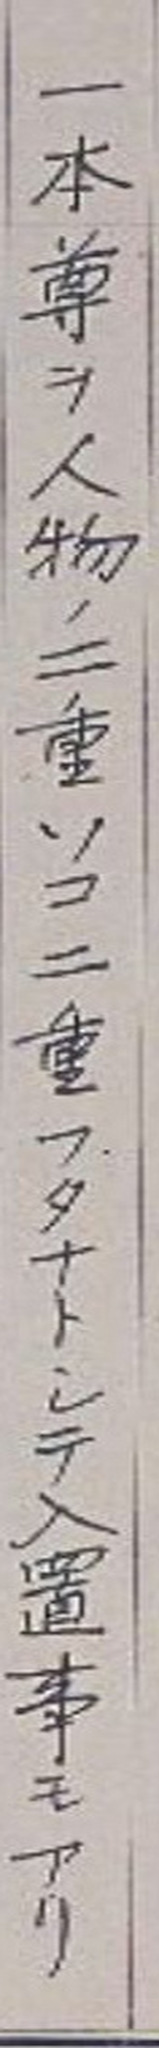一本尊を人物の二重そこに重ふたなとして入置事もあり
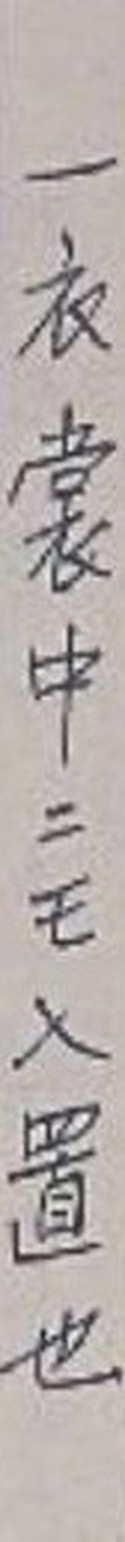一衣裳中にも入置也
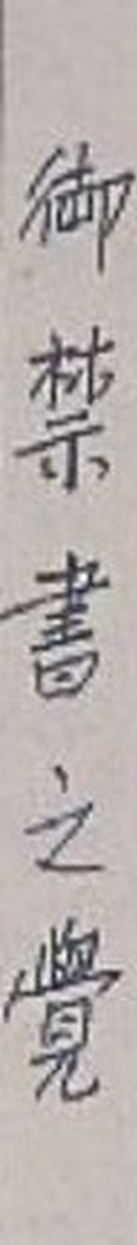御禁書之覚
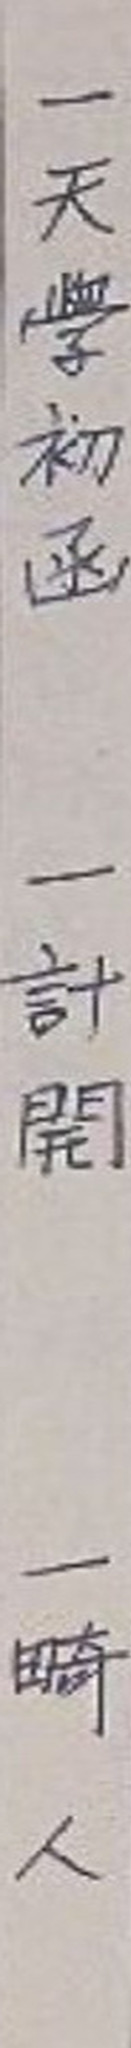一天学初函一計開一畸人
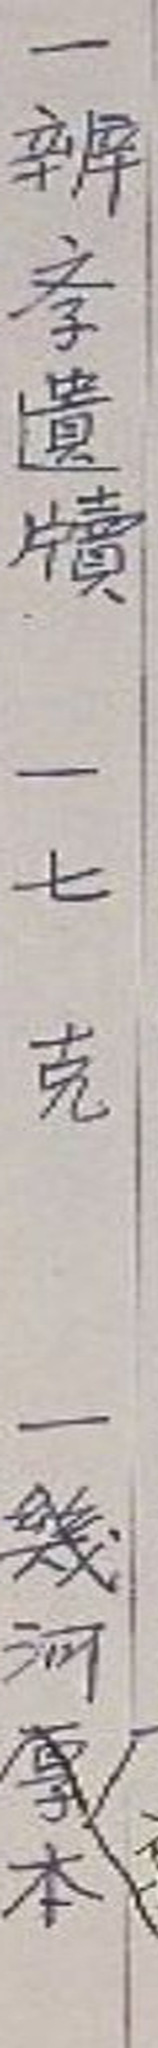一弁斈遺牘一七克一幾河原本
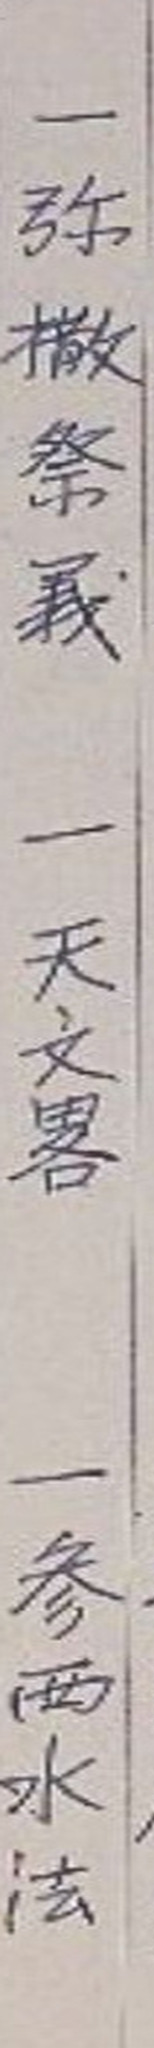一弥撒祭義一天文略一参西水法
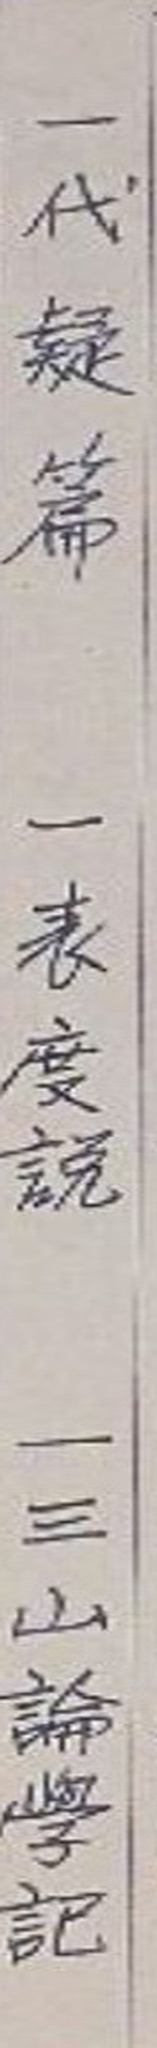一代疑篇一表度説一三山論学記
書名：支那冊封使来琉諸記 下巻
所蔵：University of the Ryukyus Library
